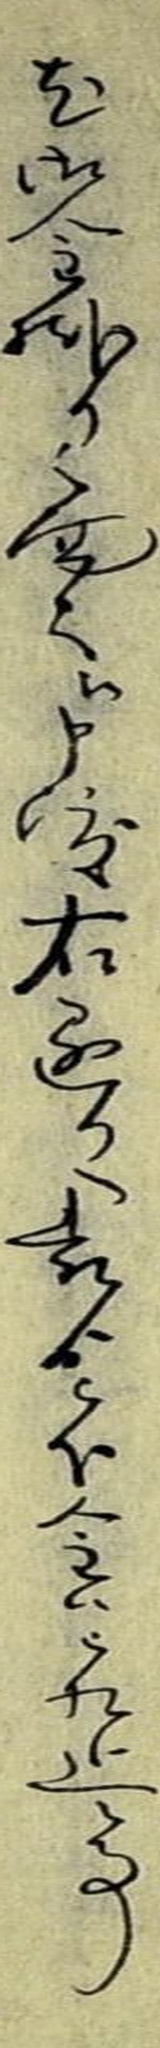尤御金掛り之面々え申渡右懸りへ表ゟ被下金は被相止候事
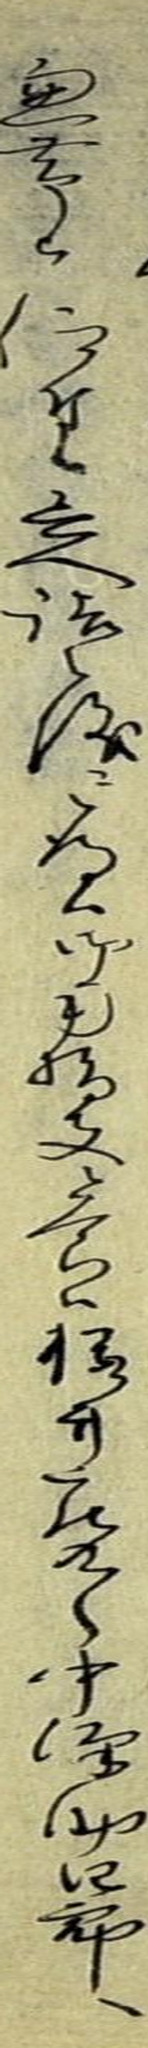兼帯被仰付候壱人詰之儀に候得は御用指支候節は桜井庄九郎中沢助四郎へ
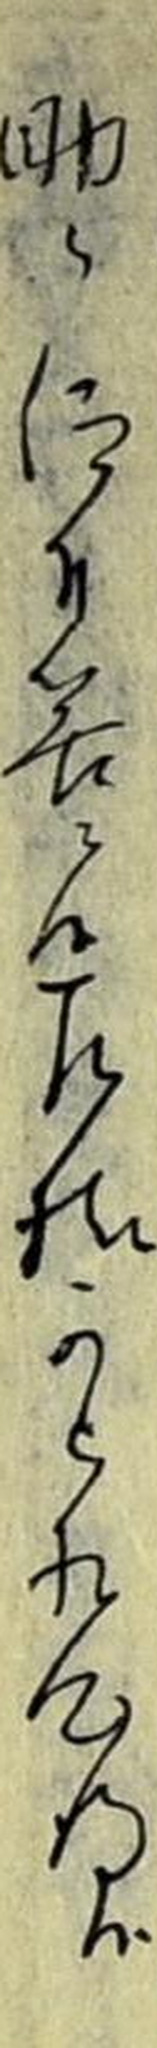助被仰付筈に候左様可被相心得候
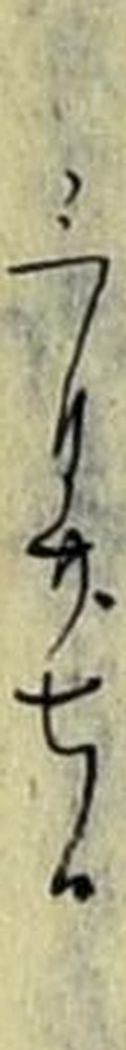三月廿七日
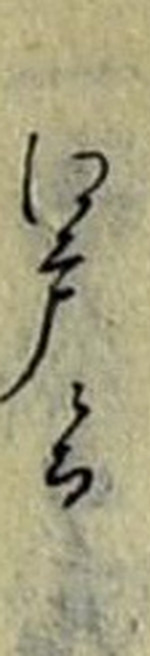江戸に而
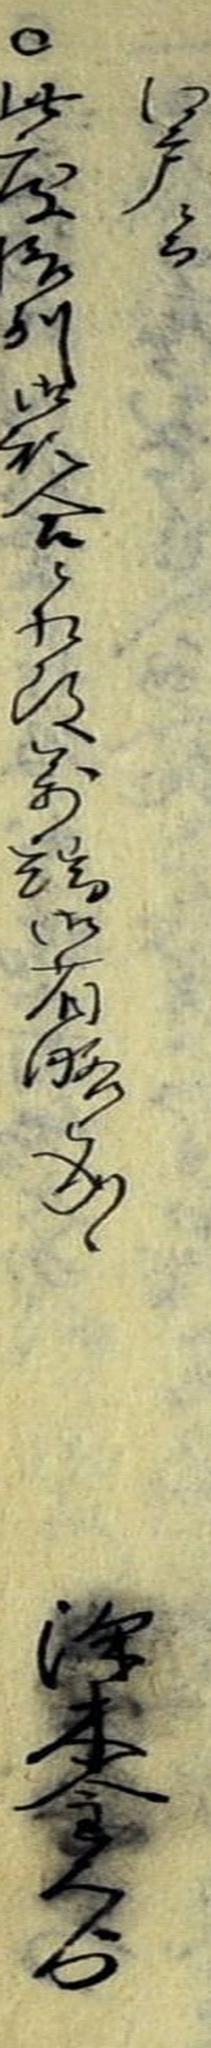〇此度格別御形合被相改万端御省略被成候澤木金右衛門
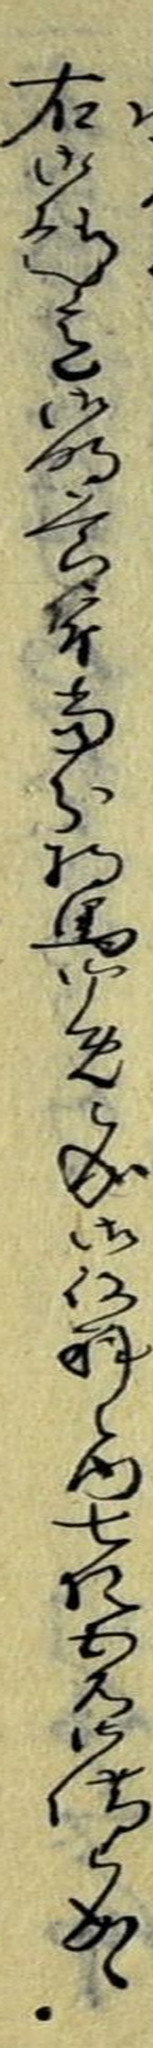右御趣意御時節に付当分持馬御免被成御役料之内七拾五石御借被成候

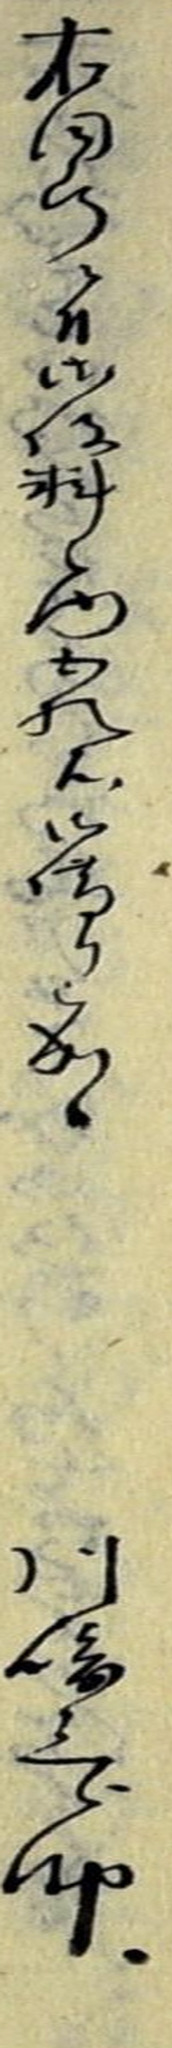右同断に付御役料之内五拾石御借り被成候川崎三郎助
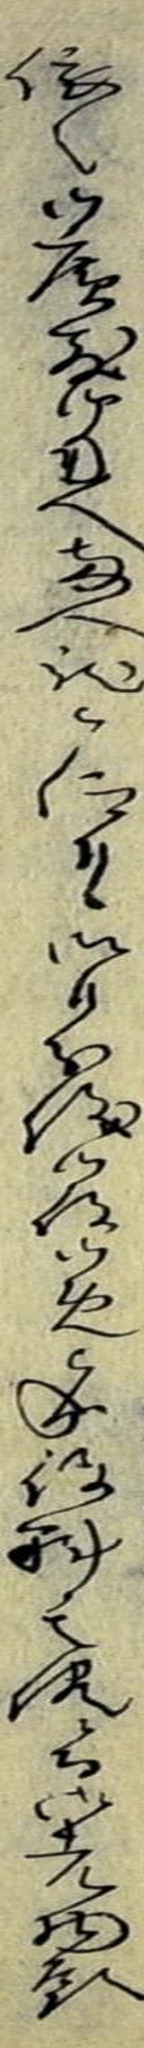依之御広敷御用人両人就被仰付候御自分儀御役御免被成役料其侭に而御先物頭
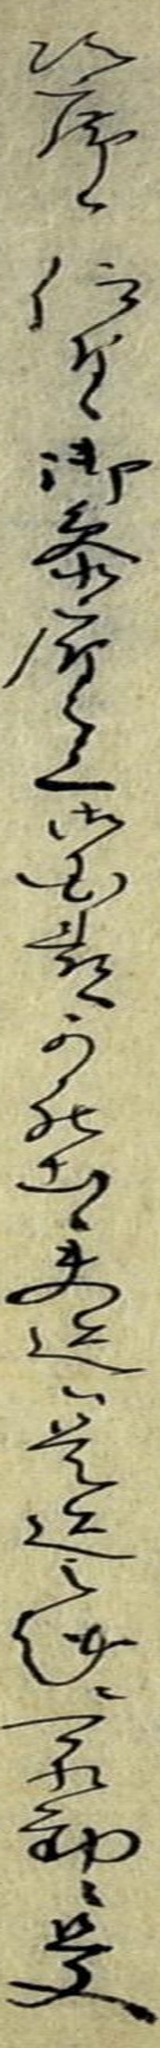次席被仰付候御参府之上御国表へ可罷出候夫迄は是迄之趣に可相勤候事
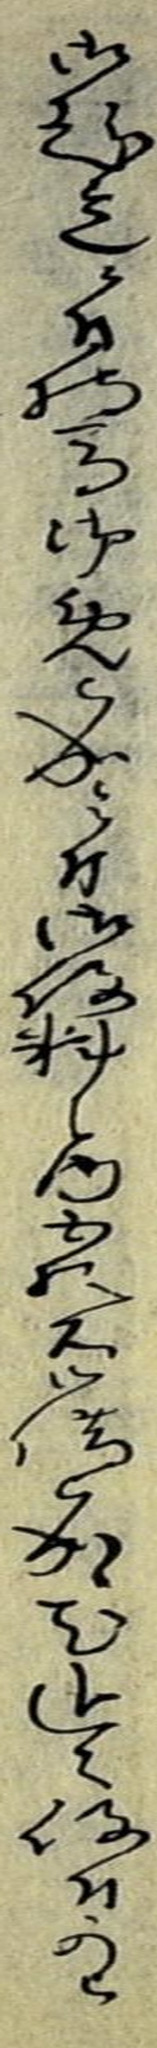御趣意に付持馬御免被成候に付御役料之内五拾石御借被成候尤追々役付可被
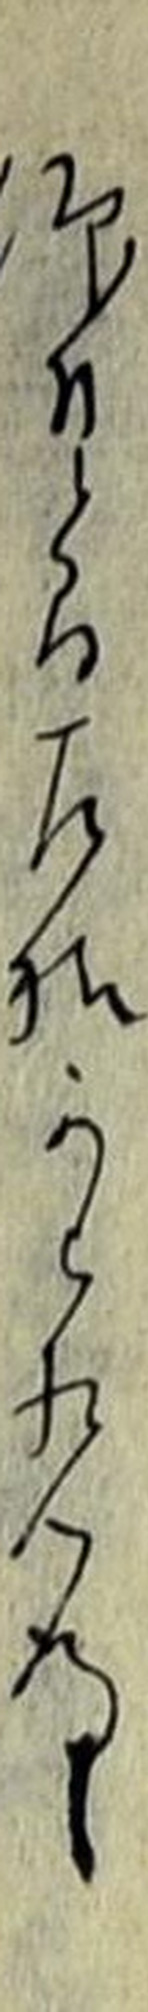仰付候間左様可被相心得候
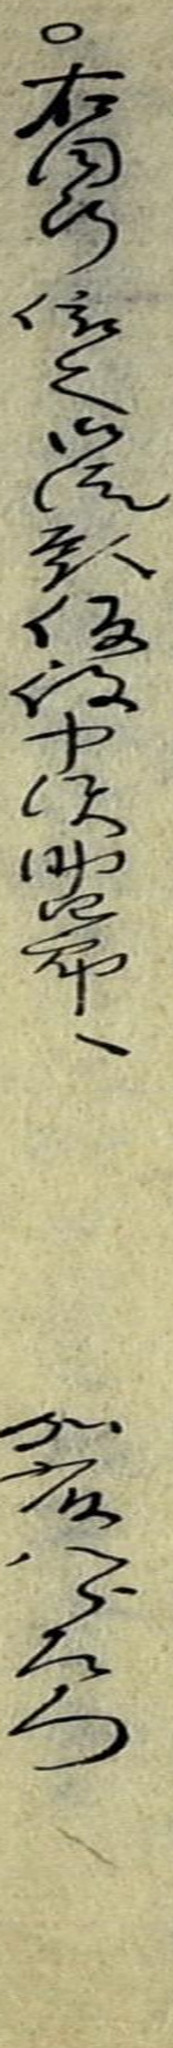〇右同断依之御徒頭仮役中沢助四郎へ加藤八郎左衛門
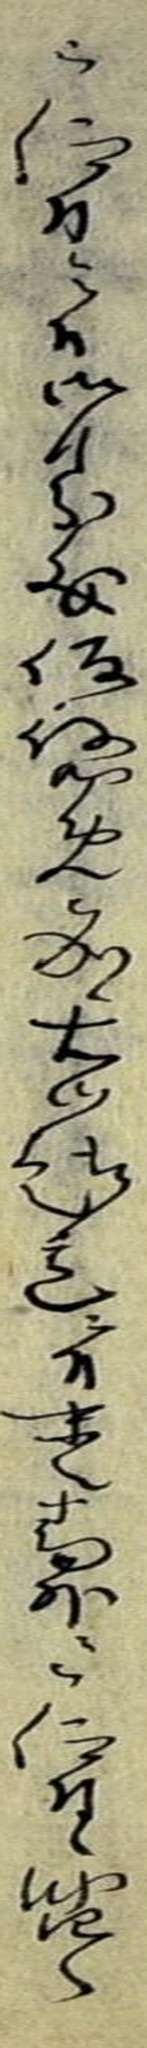被仰付候に付御自分義仮役御免被成候右御趣意に付末之番外に被仰付候助四郎
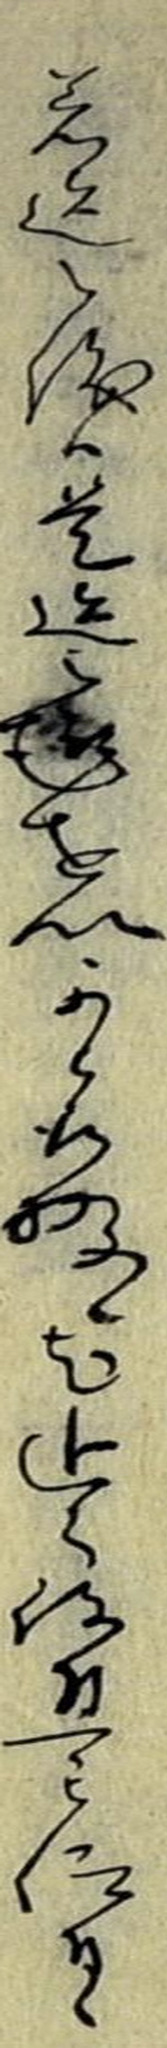着迄之儀は是迄之趣を以可被取扱候尤追々役付可被仰付候
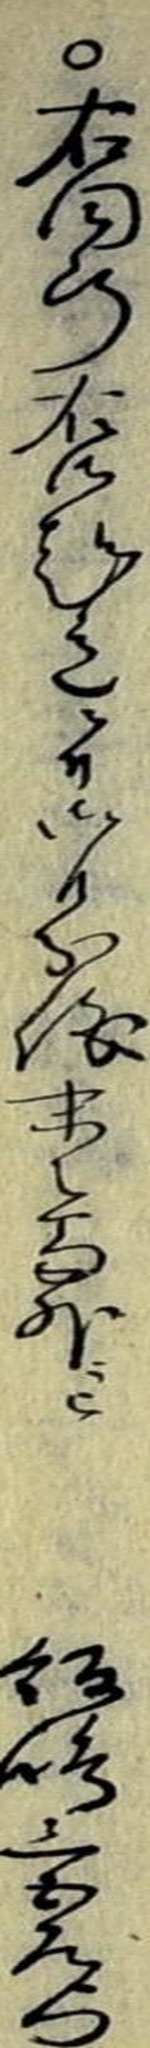〇右同断右御趣意に付御自分儀末之番外に被飯嶋三五左衛門
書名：命令之部 二
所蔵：福井県文書館 Fukui Prefectural Archives
